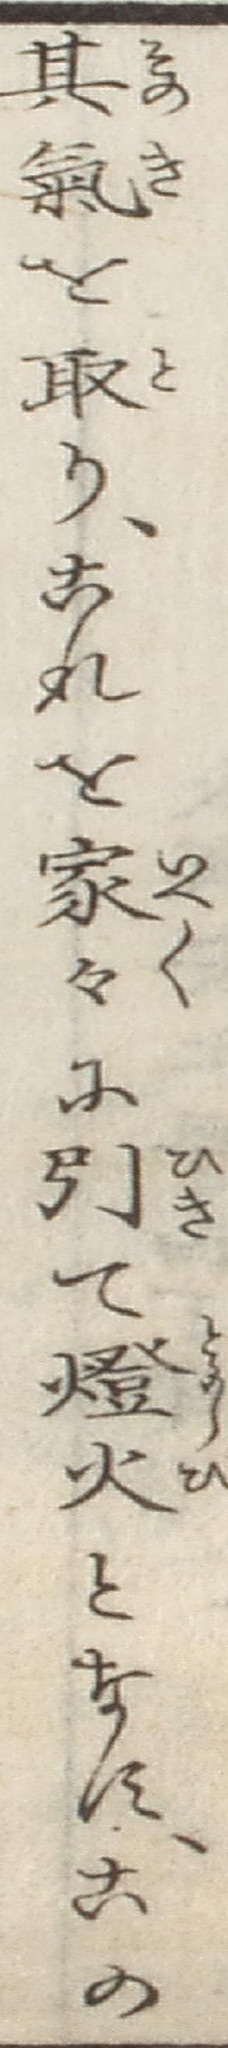其気を取り、これを家々に引て燈火となす、この
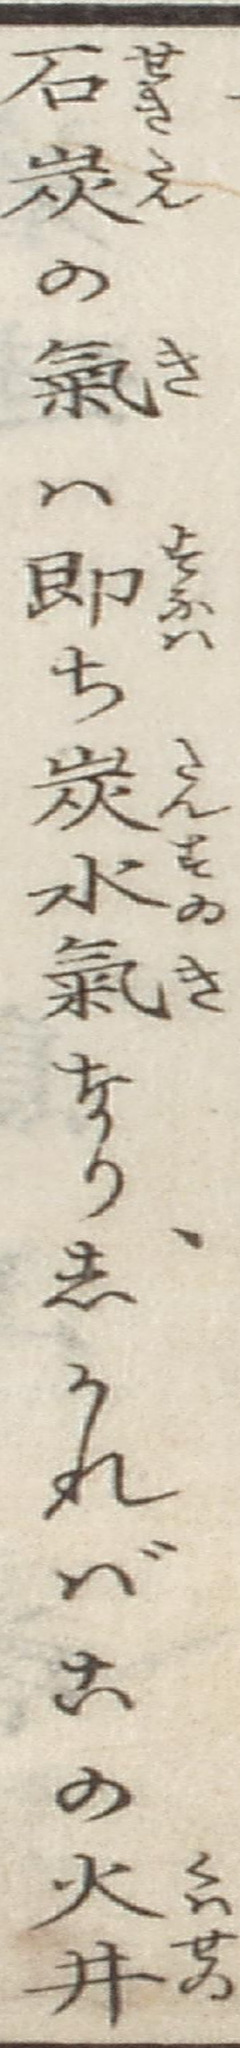石炭の気は則ち炭水気なり、しかればこの火井
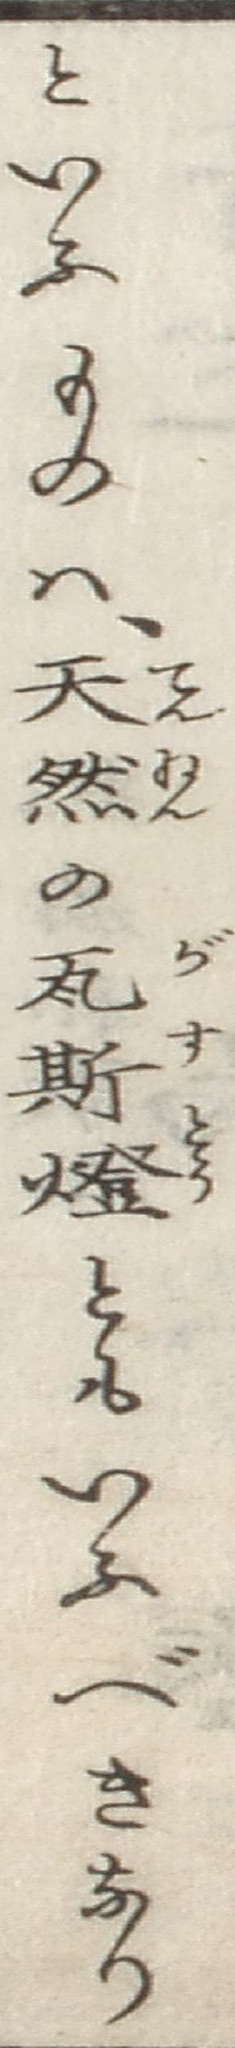といふものは、天然の瓦斯燈ともいふべきなり
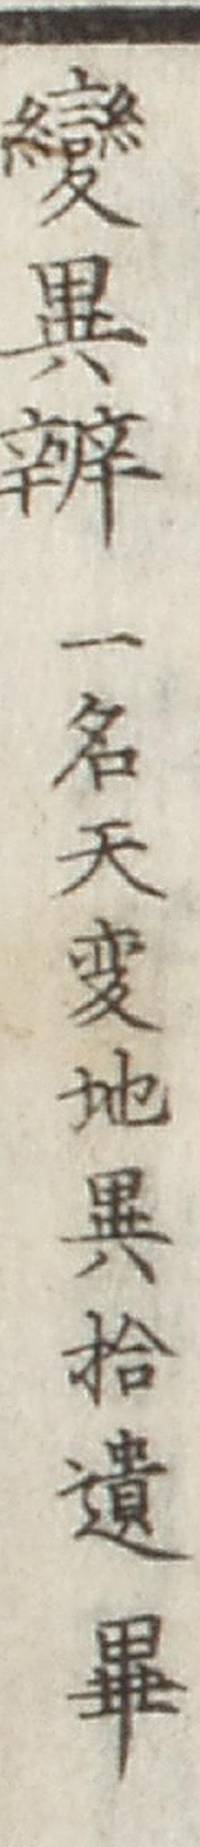変異辨一名天変地異拾遺畢

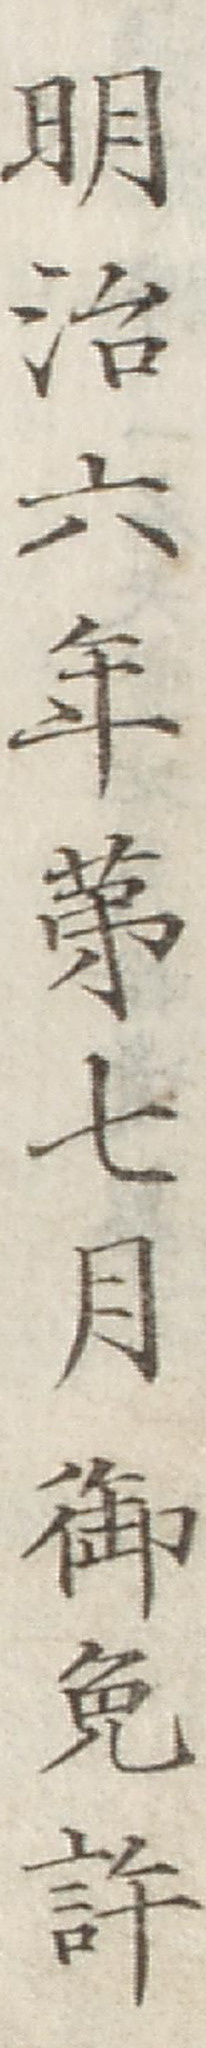明治六年第七月御免許
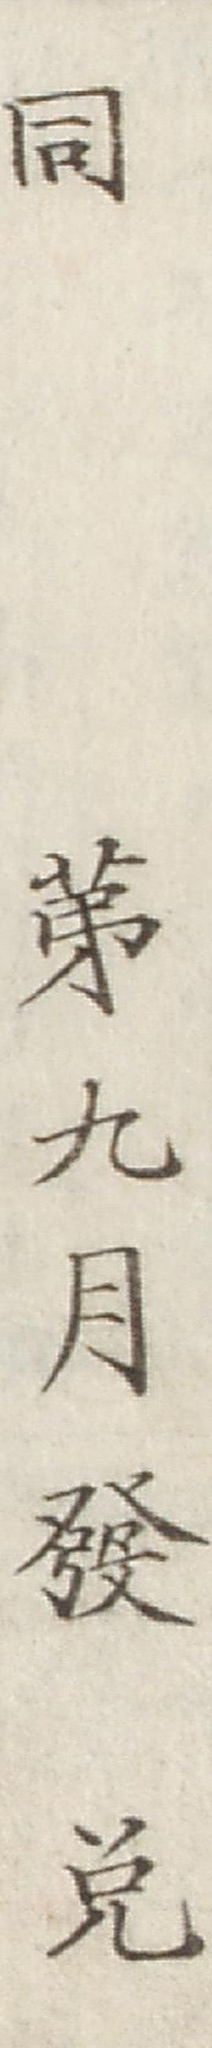同第九月発兌
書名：変異辯　一名、天變地異拾遺　全
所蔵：東京大学地震研究所図書室 Earthquake Research Institute Library, The University of Tokyo, JAPAN
